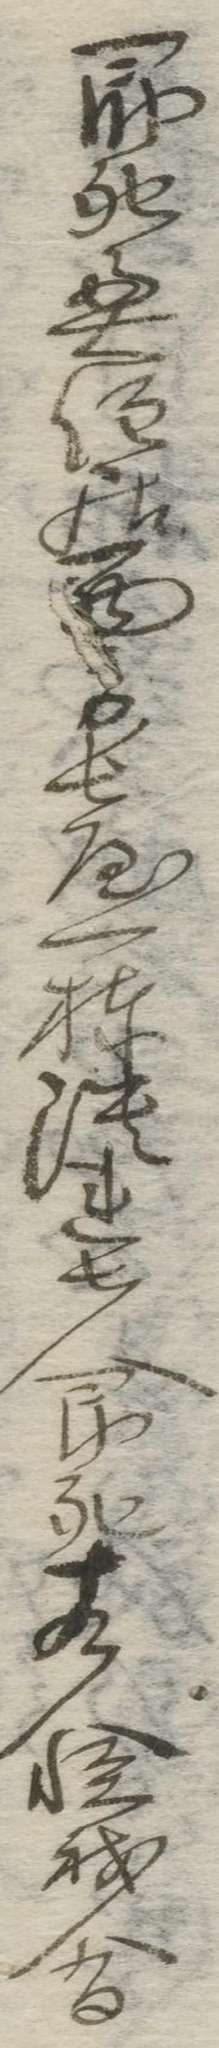即死奥住居西方長屋一棟潰れ七人即死十九人怪我人有
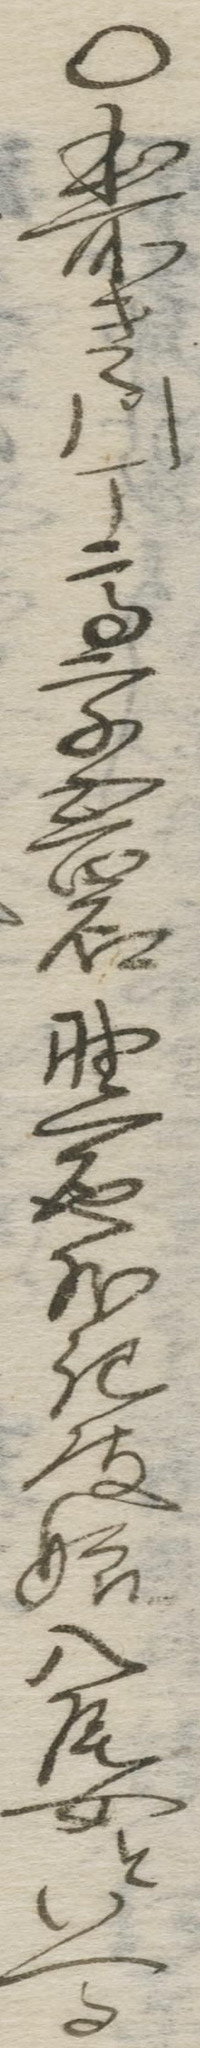○本所きく川丁高二千五百石野一色外記殿娘八尾女といへる
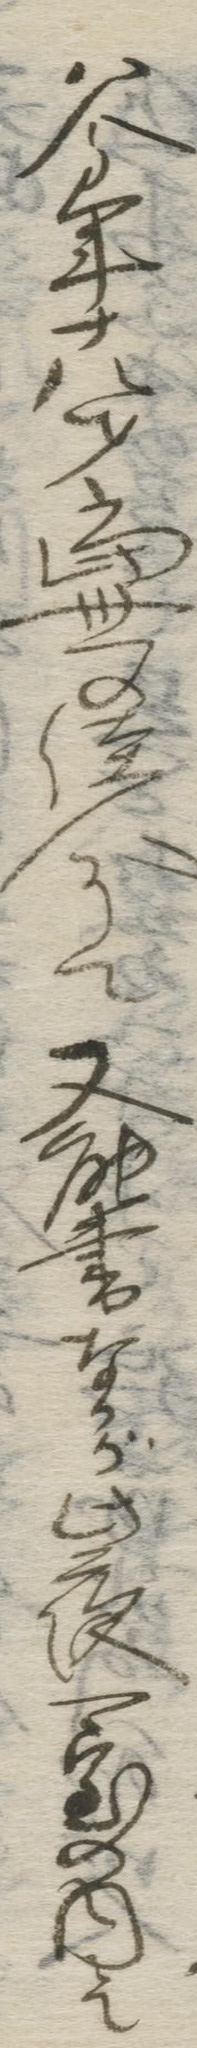ハ今年十八才当世の佳人にて又能書なるが此夜一室の内ニて
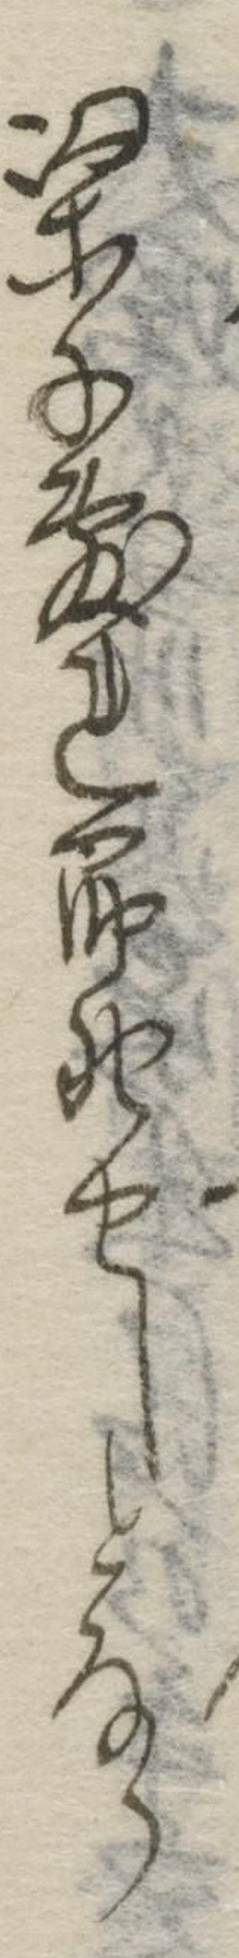梁に敷れ即死せしとなり
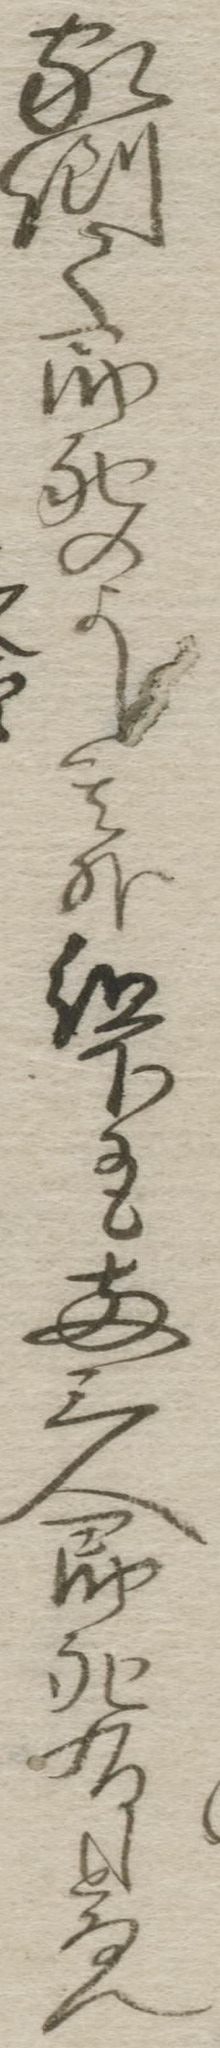家倒て即死のよし其外組下にも両三人即死有之となん
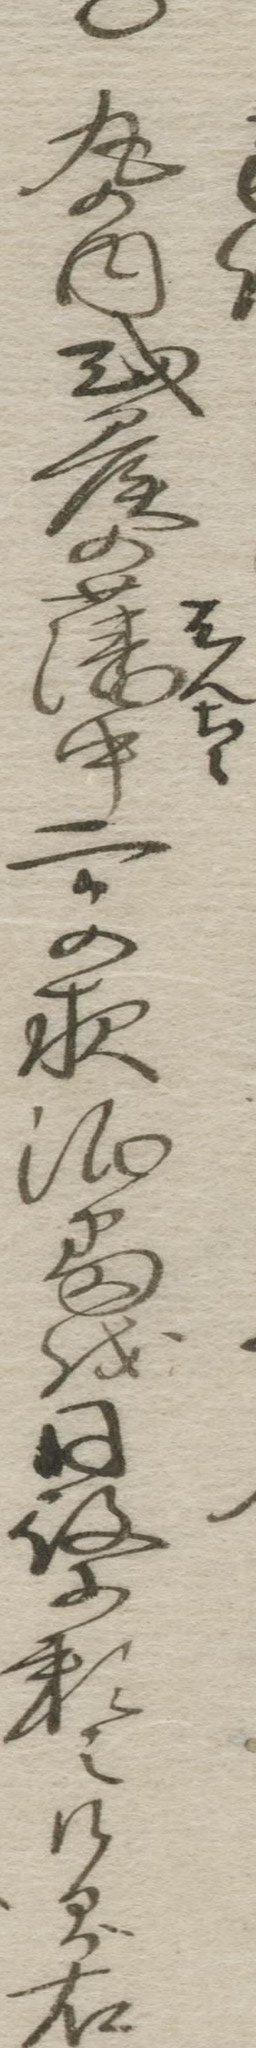〇丸の内越侯の藩中二日の夜泊番を同役に頼ミ同日ゟ右
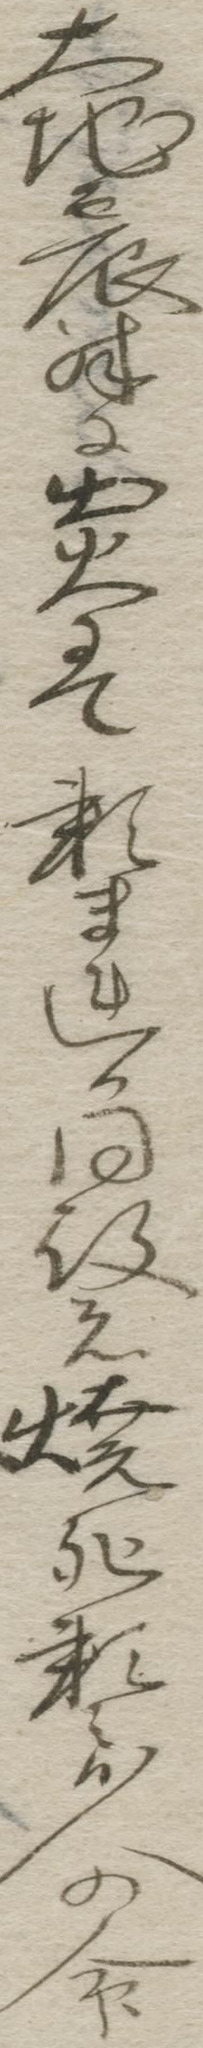大地震殊に出火にて頼まれり同役者焼死頼み候人の命
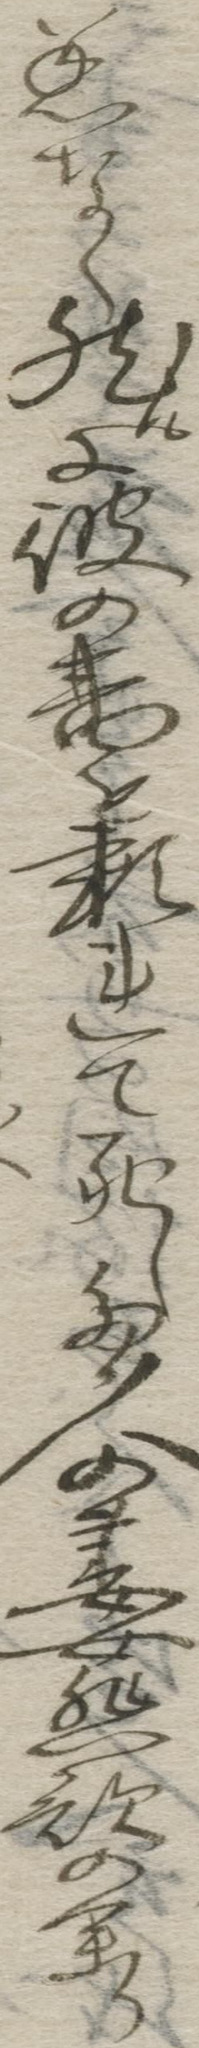恙なく然ルに彼の番を頼れて死したる人の妻女悲嘆の余り
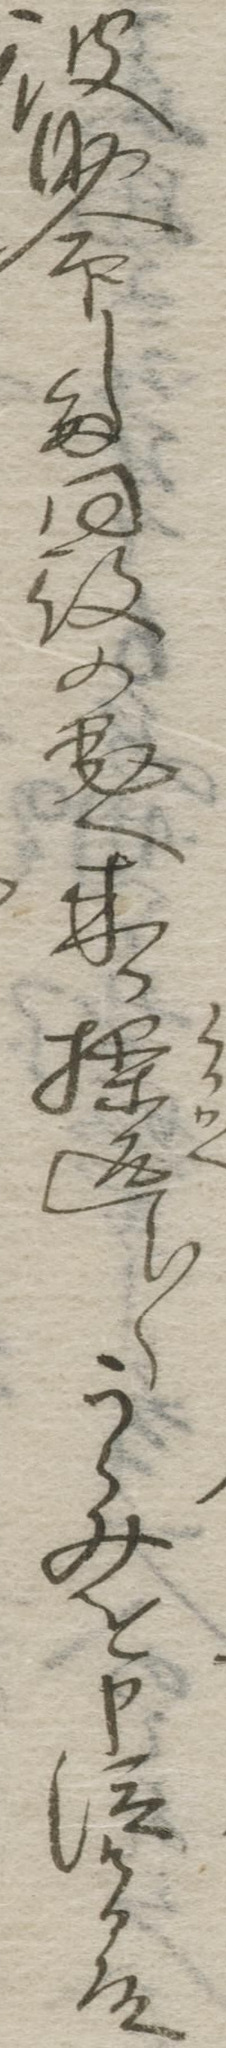彼助命した同役の宅へ来り繰返し繰返しうらみを申談ける故
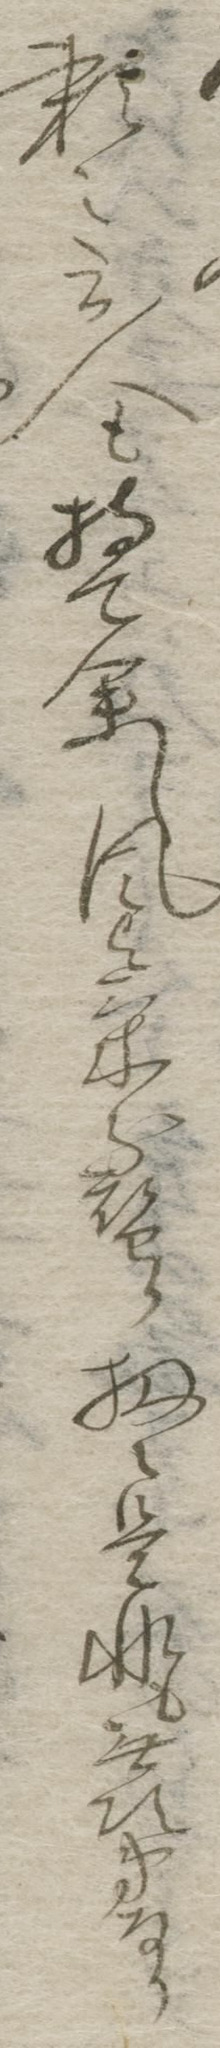頼ミたる人も持て余し風与気分替り扨々是非も無次第なり
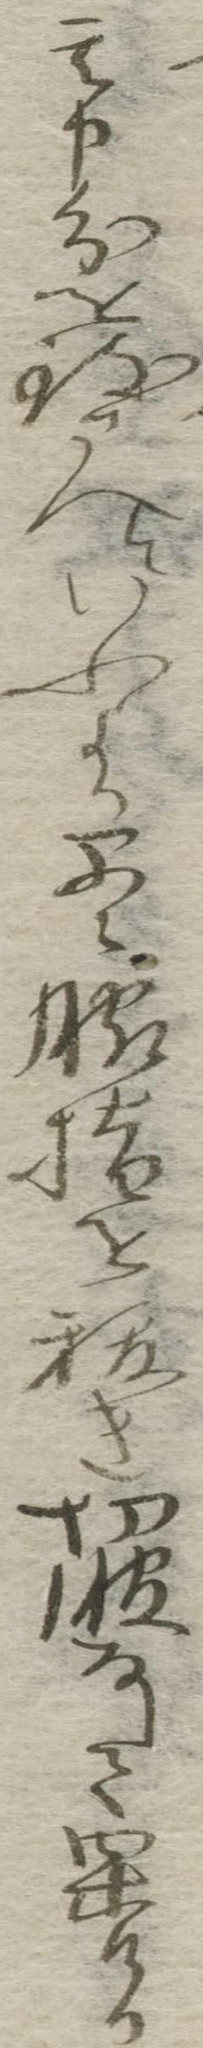其申分を致さんといふより早々脇指を抜き切腹なして果けり
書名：江戸中諸屋敷　地震竒談録
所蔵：東京大学地震研究所図書室 Earthquake Research Institute Library, The University of Tokyo, JAPAN
